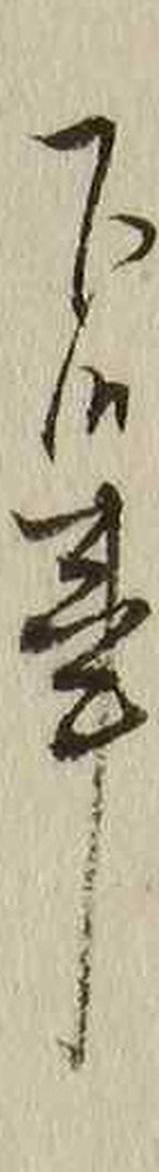下候事
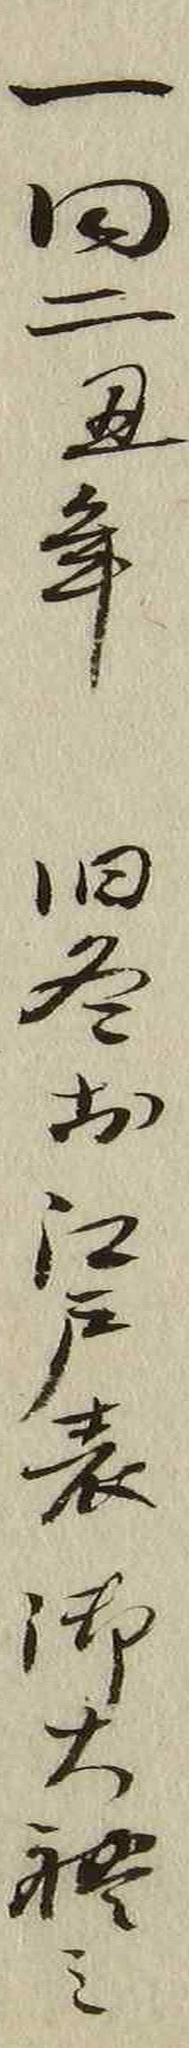一同二丑年旧冬於江戸表御大礼之
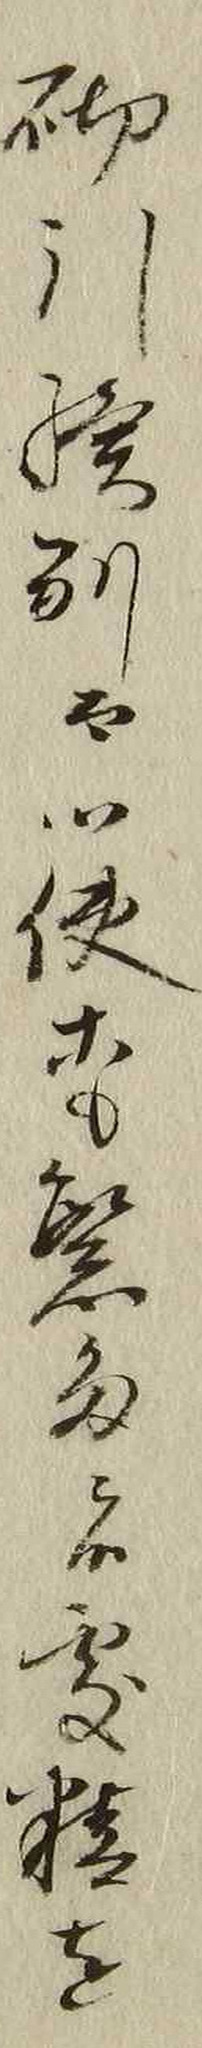砌引続別而御使等も繁多ニ候処精を
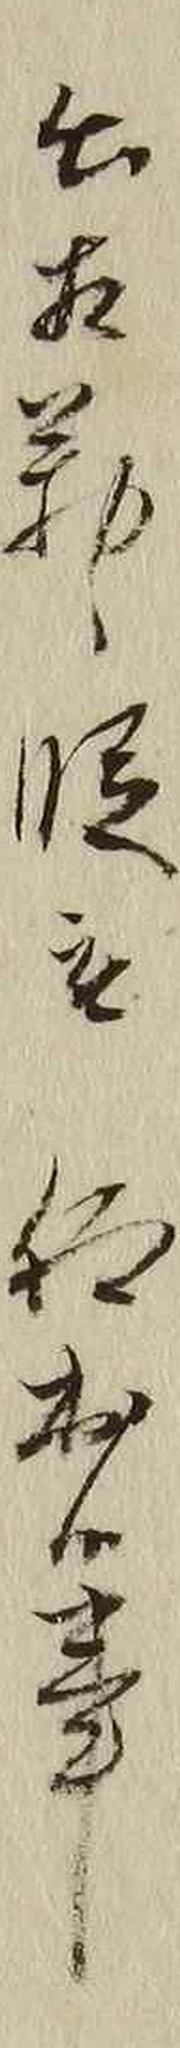出相勤候段被仰出候事
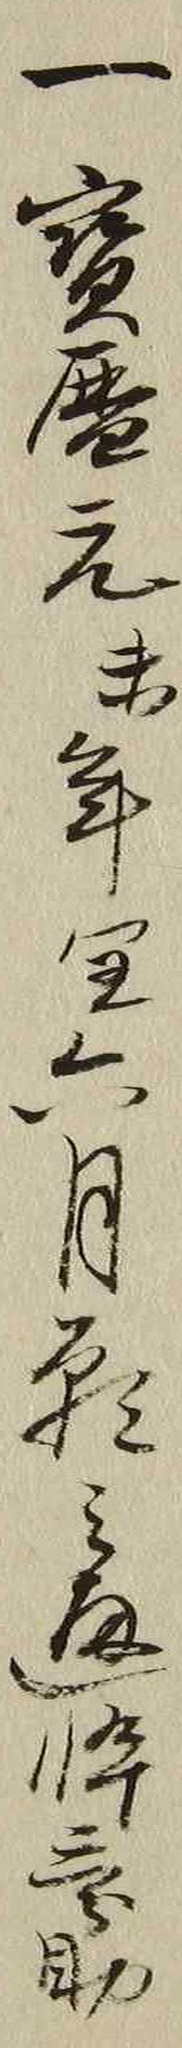一宝暦元未年閏六月願之通忰三郎助
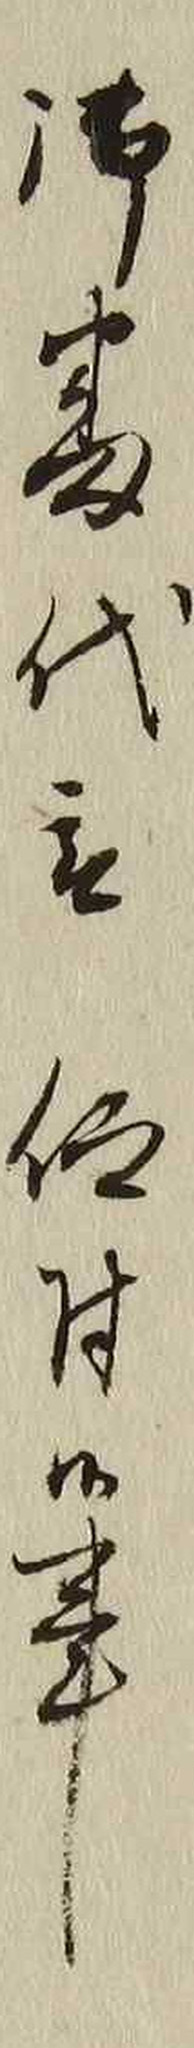御番代被仰付候事
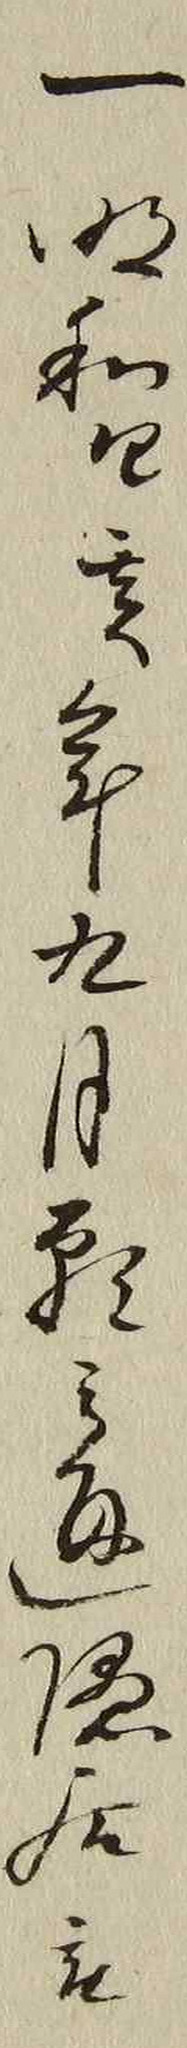一明和四亥年九月願之通隠居被
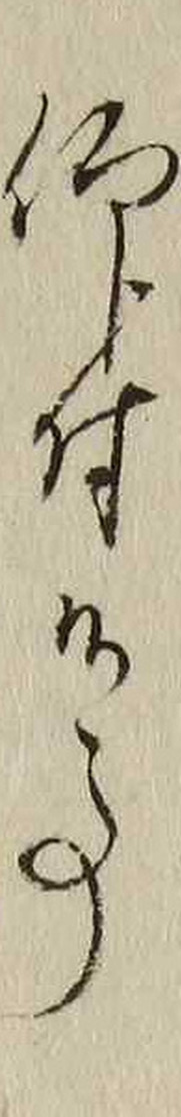仰付候事
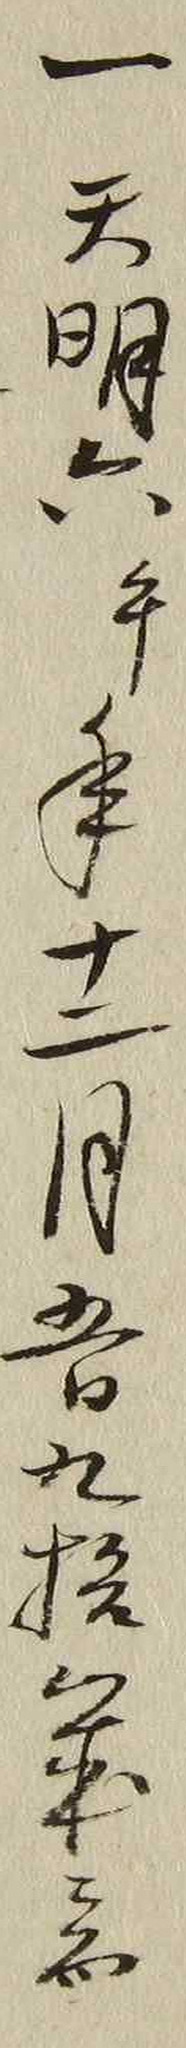一天明六午年十二月五日九拾歳ニ而
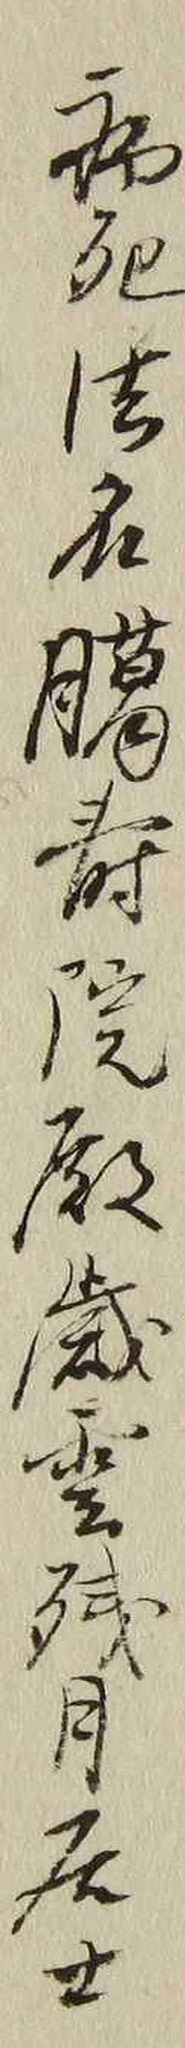病死法名臈寿院殿歳雲残月居士
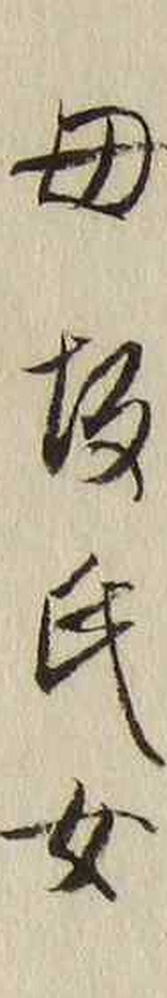母坂氏女

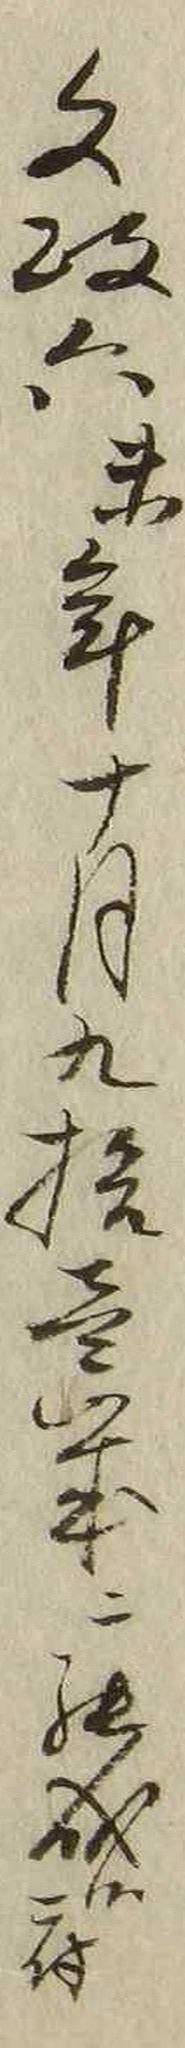文政六未年十月九拾壱歳ニ罷成候ニ付
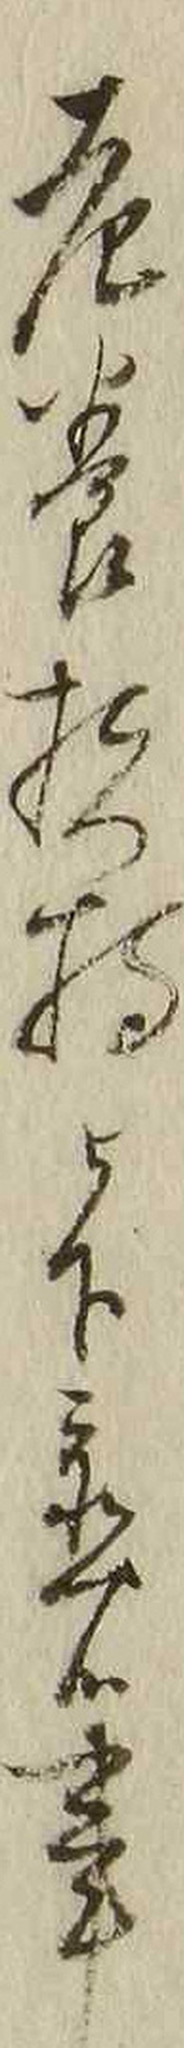老養扶持被下置候事
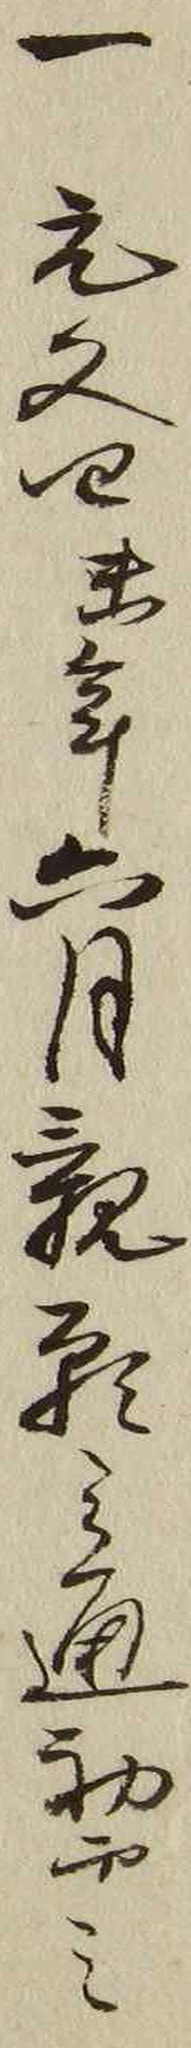一元文四未年六月親願之通初而之
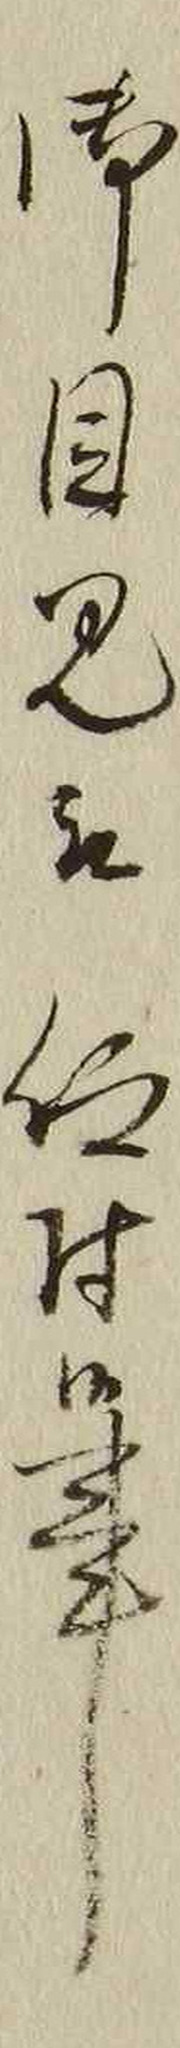御目見被仰付候事
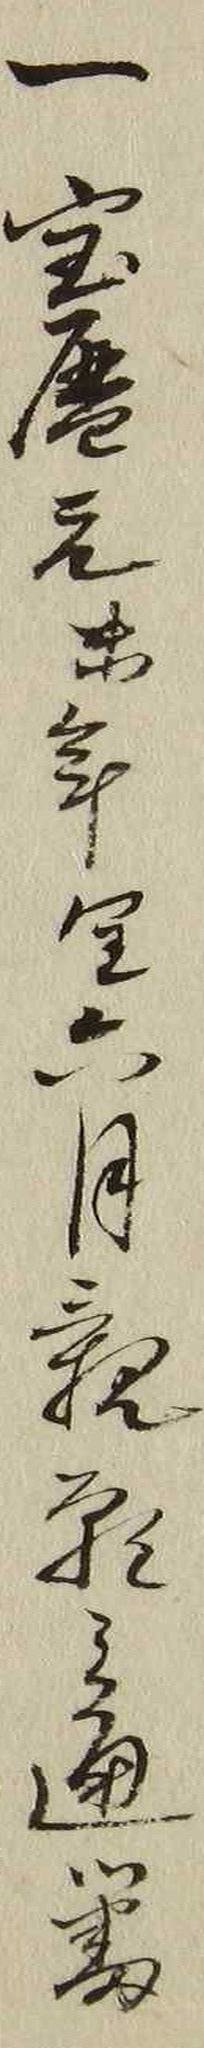一宝暦元未年閏六月親願之通御番
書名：諸士系譜　巻之359　す之部9
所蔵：会津若松市立会津図書館
